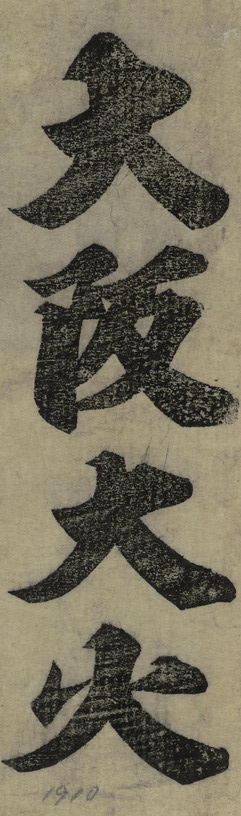大阪大火
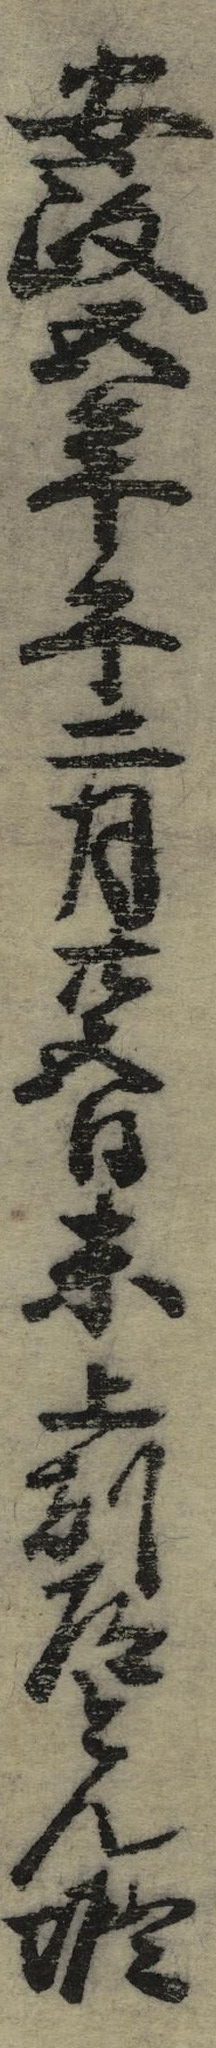安政五年午二月廿五日未上刻道とん堀
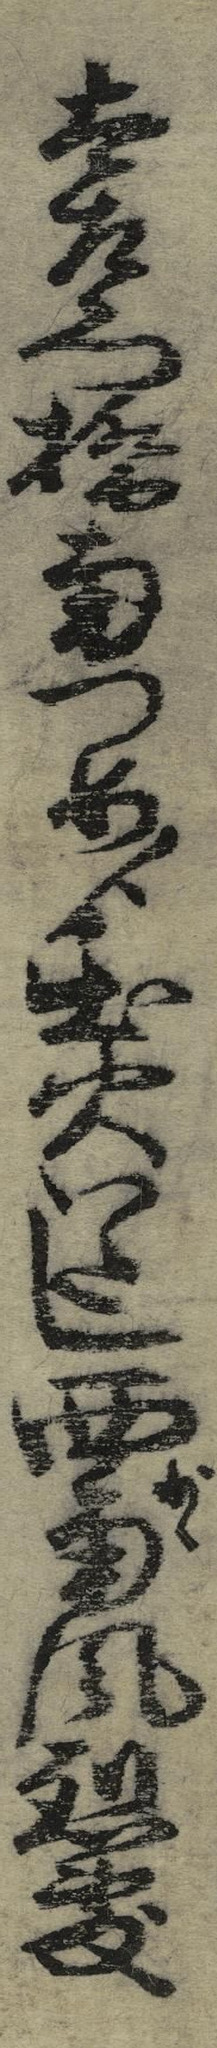太左衛門橋南つめゟ出火いたし西南風烈敷
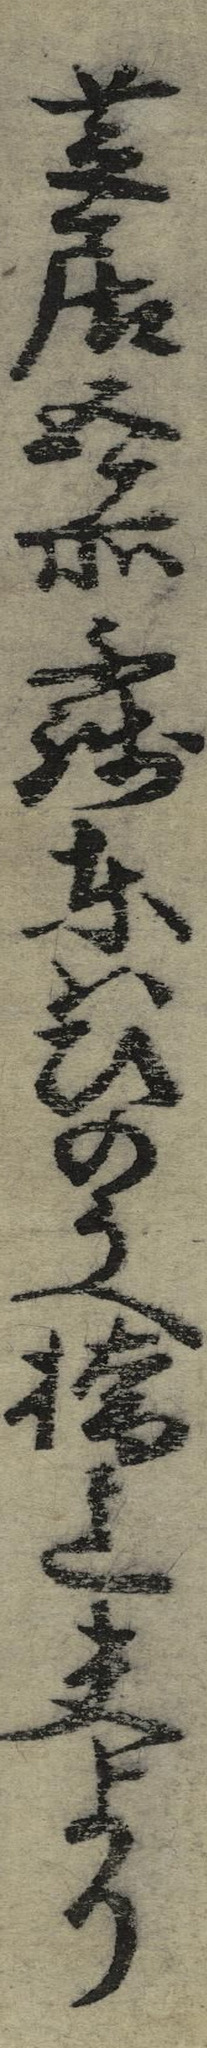芝居五ケ所不残東はひのうへ橋迄夫より
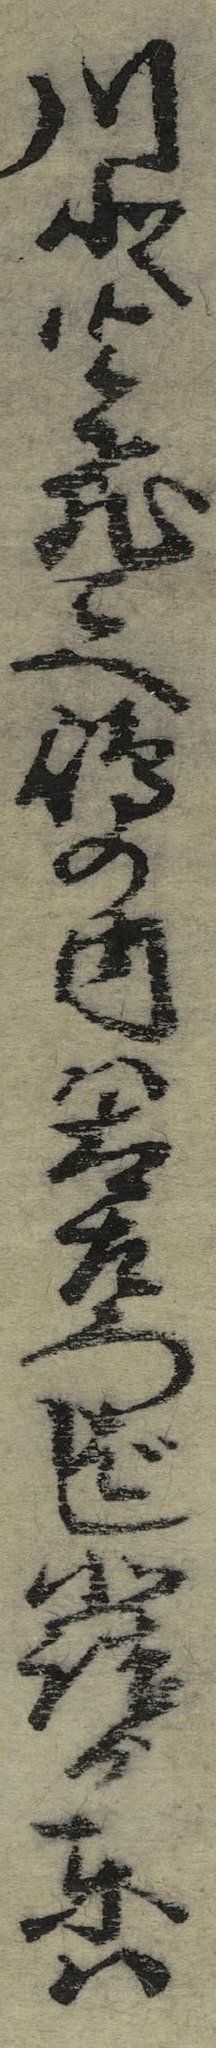川北へ火飛こへ嶋の内は太左衛門ばし北詰ゟ東は
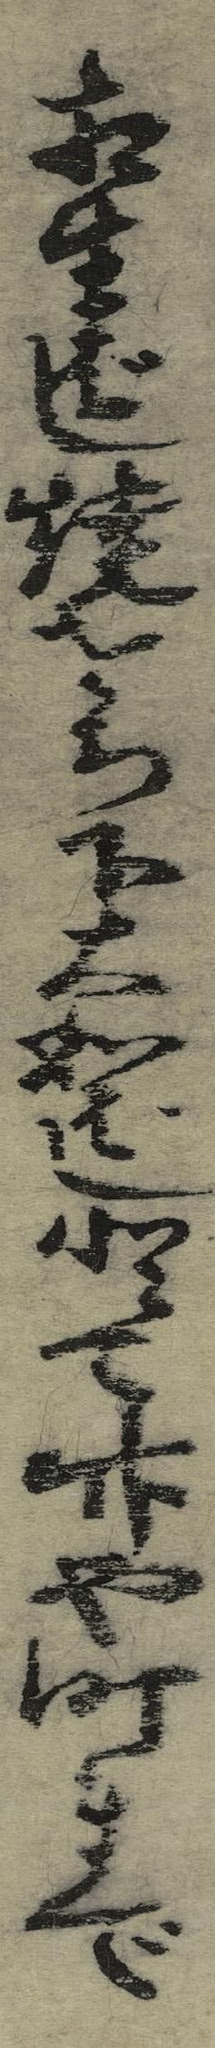相生ばし焼をち下大和ばし北にて竹や町まで
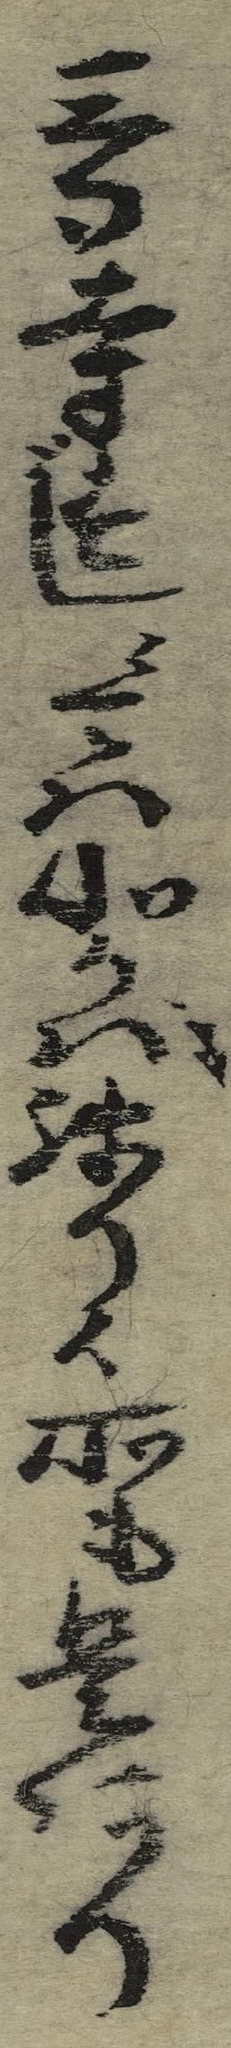三つ寺ばしにては北かは残り候所も是あり
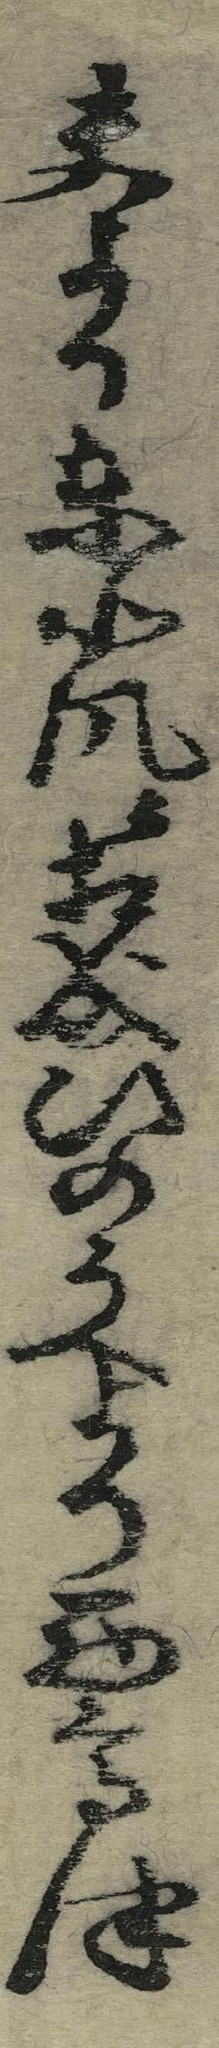夫より東北風に相成ひのうへより西高津
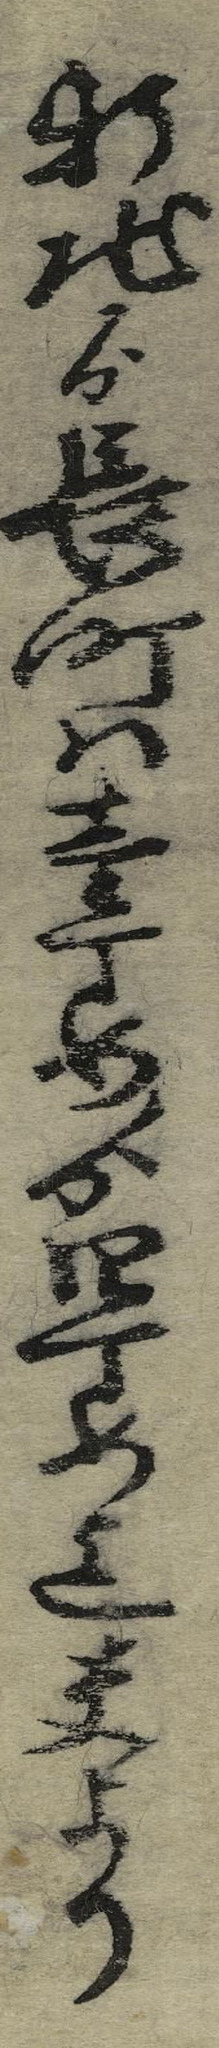新地ゟ長町は壱丁メゟ四丁メ迄夫より
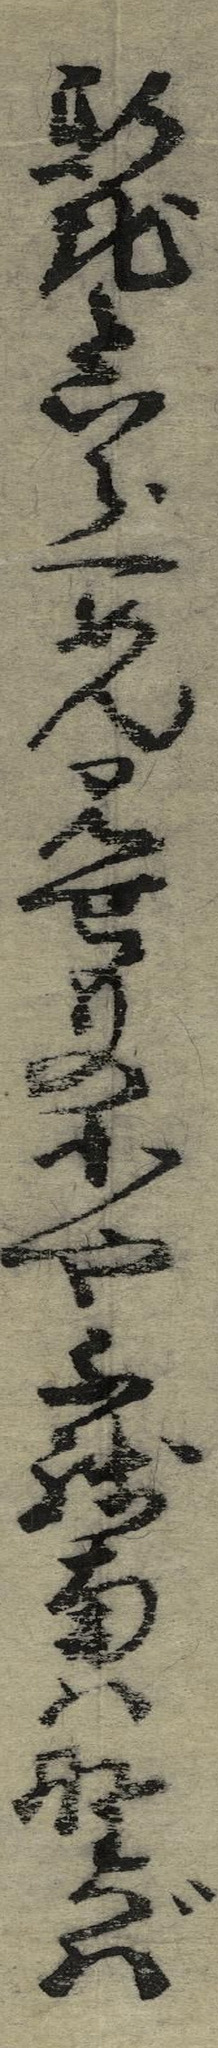新地といふ一めん見世もの小や不残南は野がは
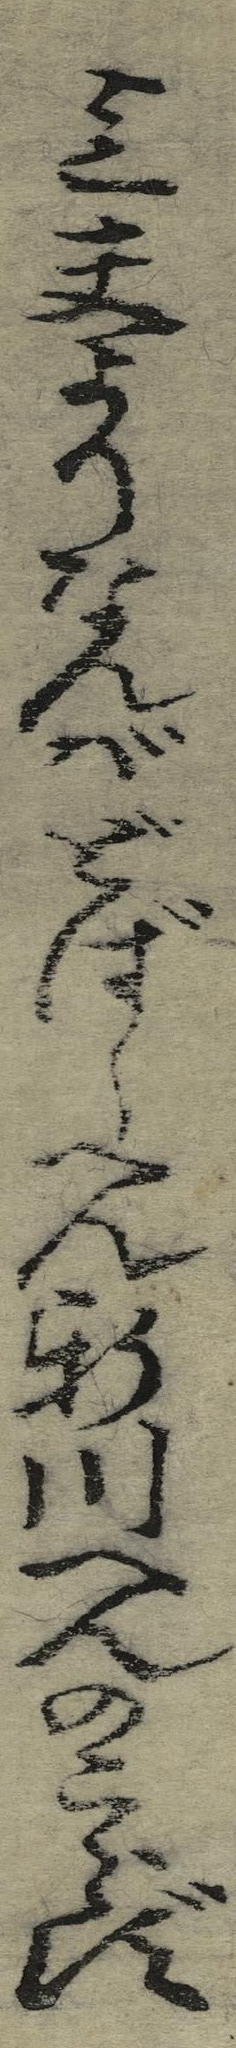迄夫よりなんばどばしへん新川へんのこらず
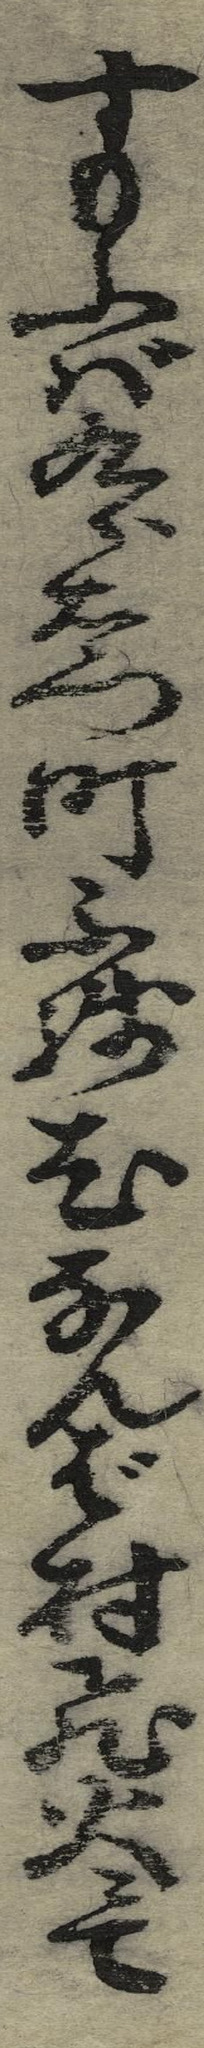すもふば九郎右衛門町不残尤なんば村飛火にて
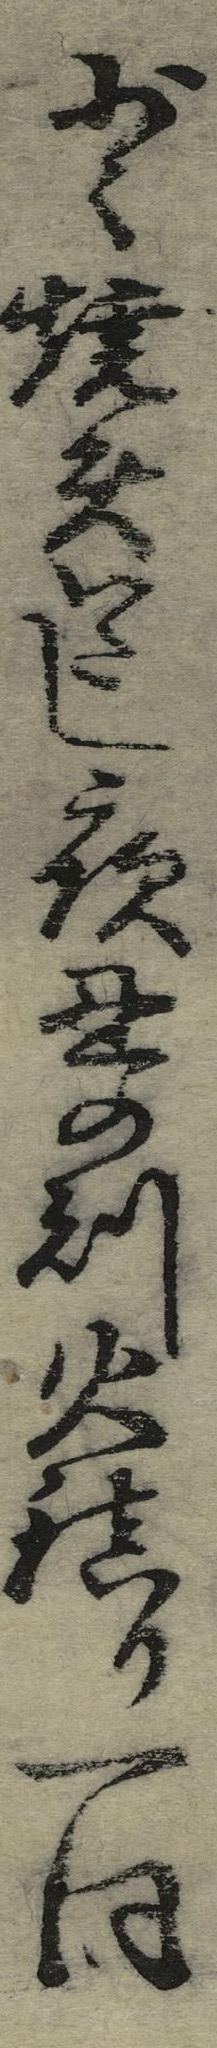少々焼失いたし夜丑の刻火鎮り一同
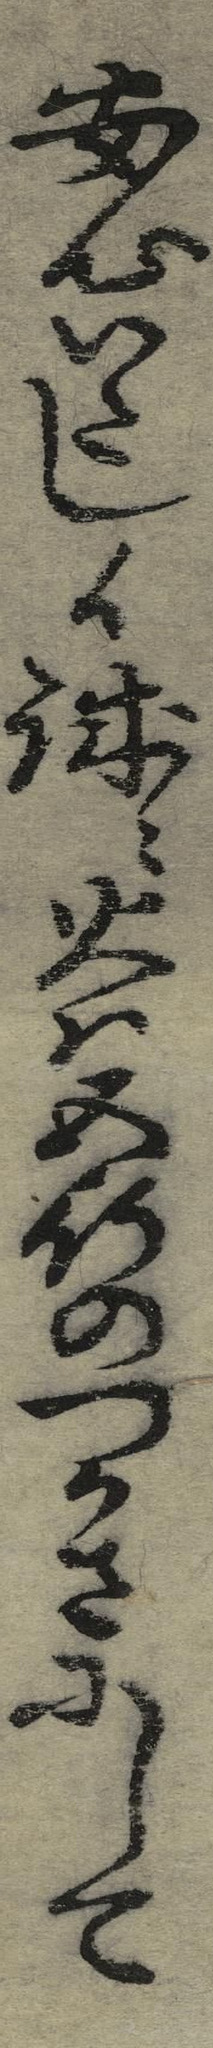安心いたし候誠に火は五行のつかさにして
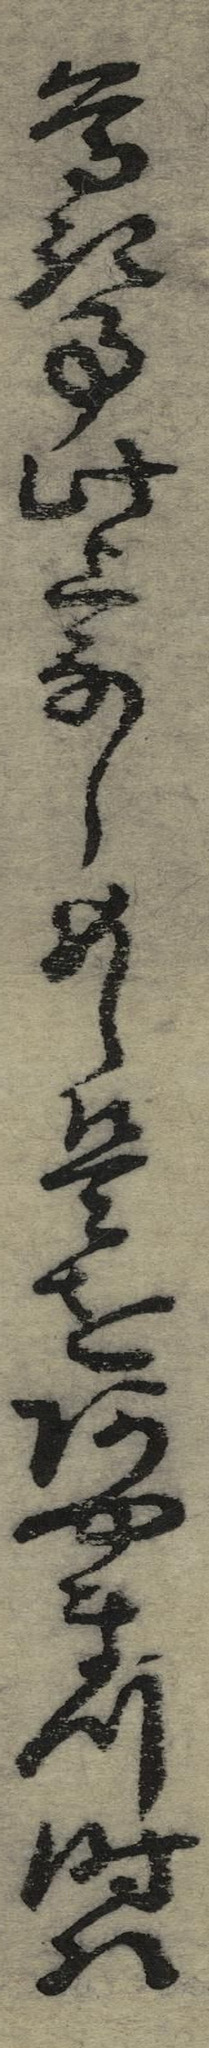尊き事此上なしもし是をあやまつ時は
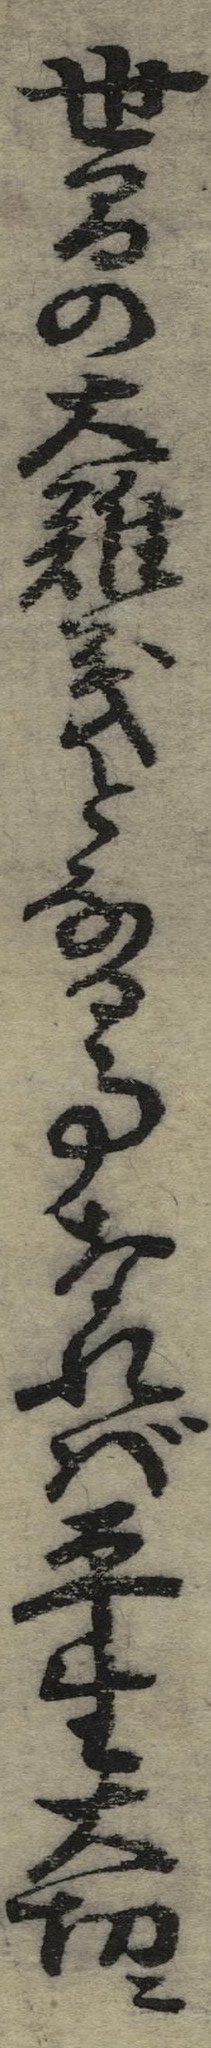世間の大難義となる事なれば平生大切に
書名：大阪大火
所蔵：東京大学地震研究所図書室 Earthquake Research Institute Library, The University of Tokyo, JAPAN
